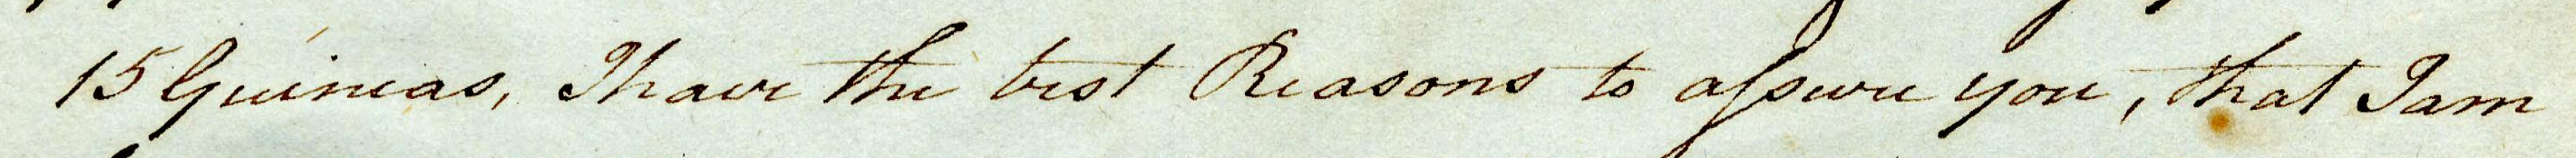15 Guineas, I have the best Reasons to assure you, that I am
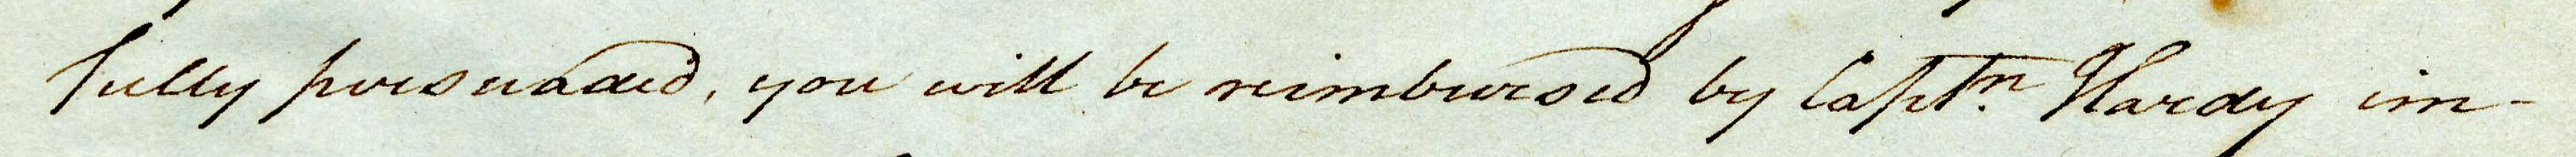fully persuaded, you will be reimbursed by Capt^n. Hardy im-
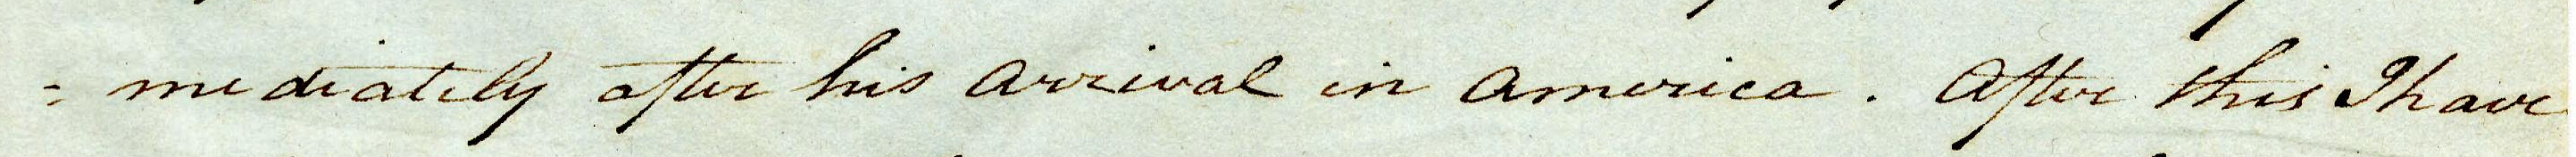-mediately after his Arrival in America. After this I have
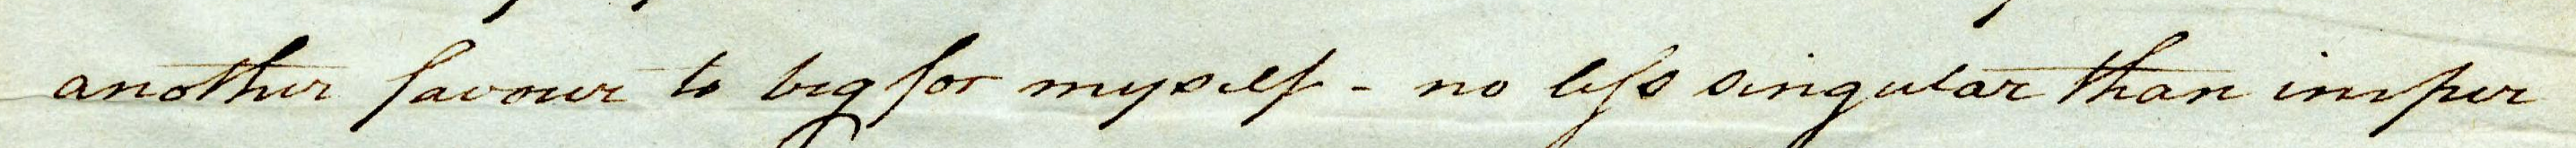another favour to beg for myself- no less singular than imper
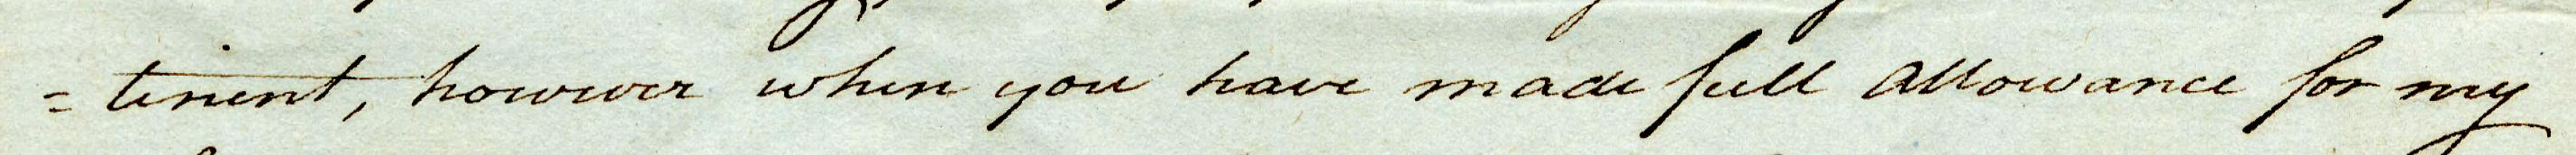-tinent, however when you have made full Allowance for my
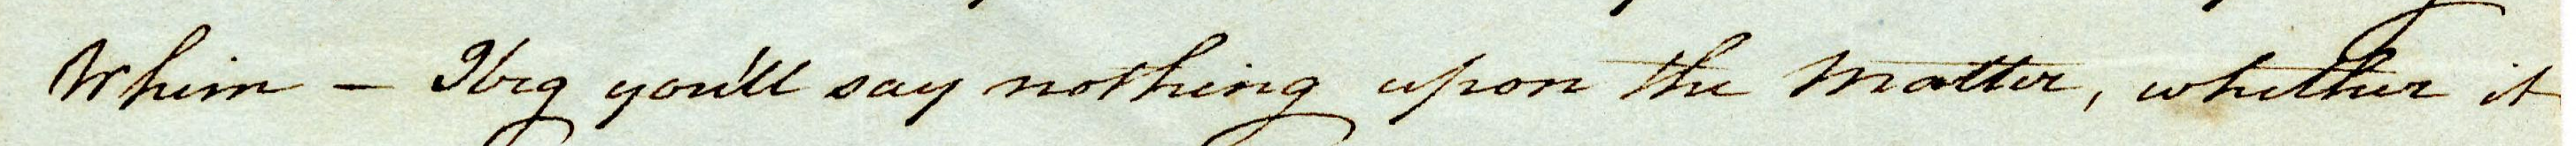Whim- I beg you'll say nothing upon the Matter, whether if
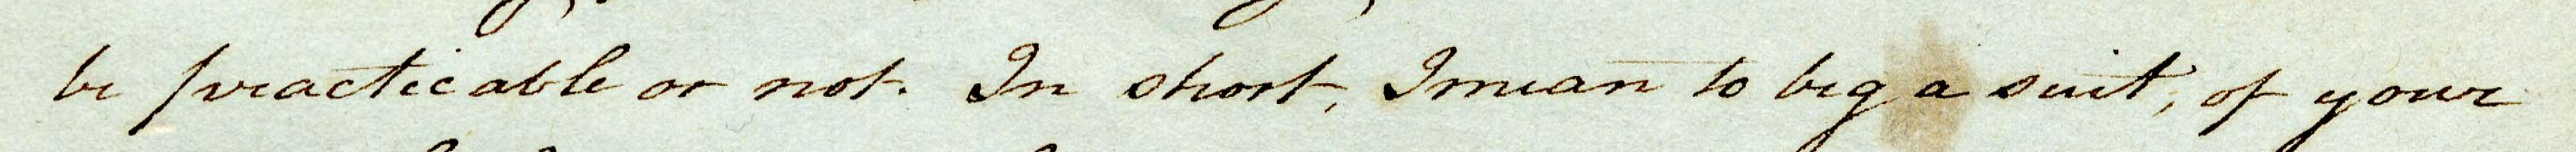to practicable or not. In short, I mean to beg a suit, of your
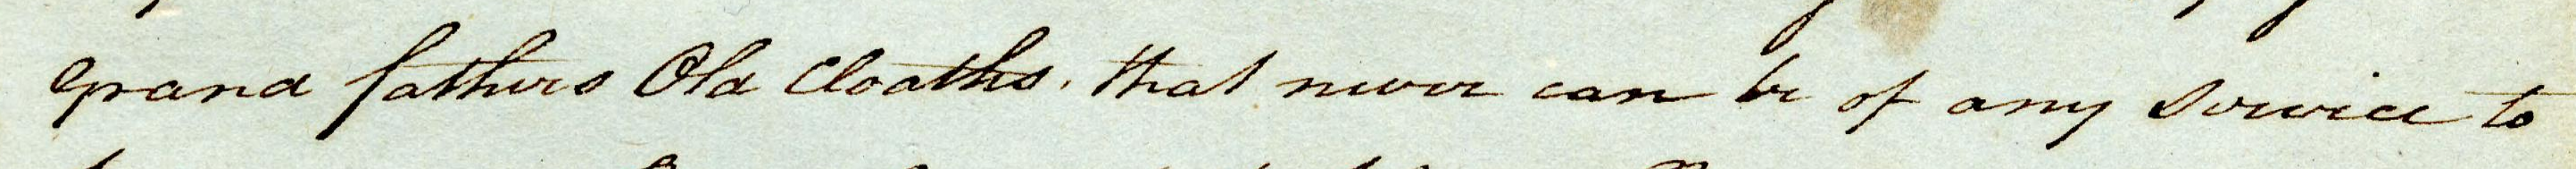Grand fathers Old Cloaths, that never can be of any service to
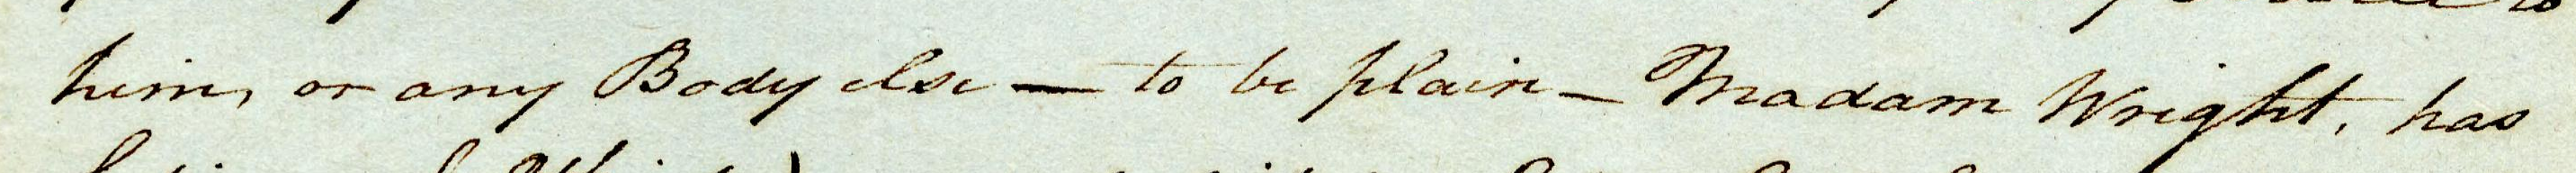him, or any body else- to be plain- Madam Wright, has
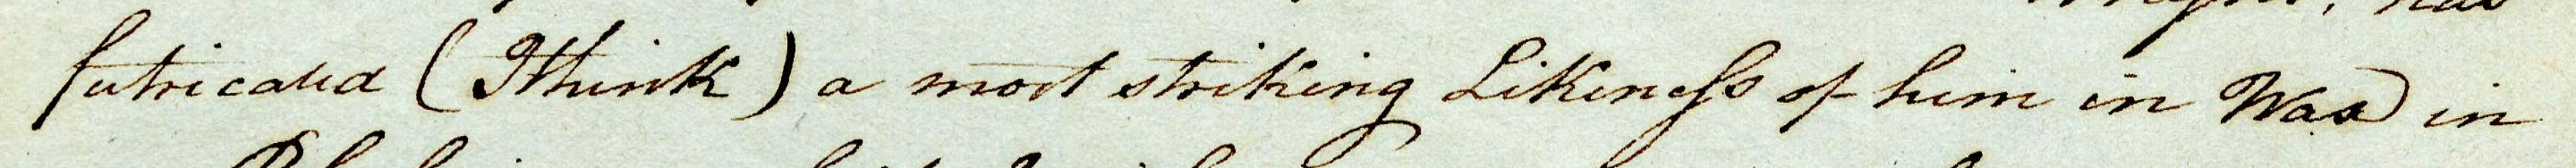fatricated (I think) a most striking Likeness of him in Wax in
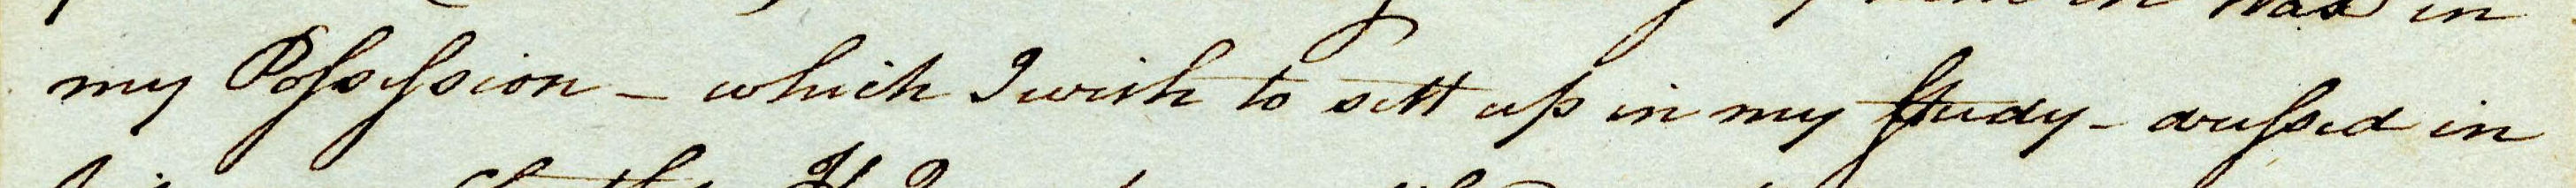my Possession- which I wish to sett up in my study- dressed in
